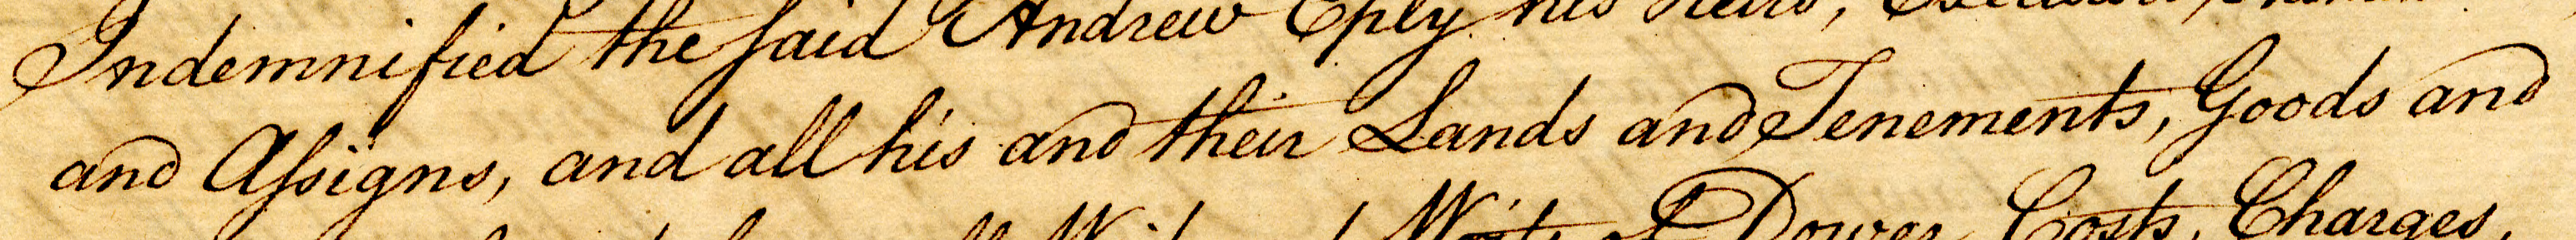and Assigns, and all his and their Lands and Tenements, Goods and
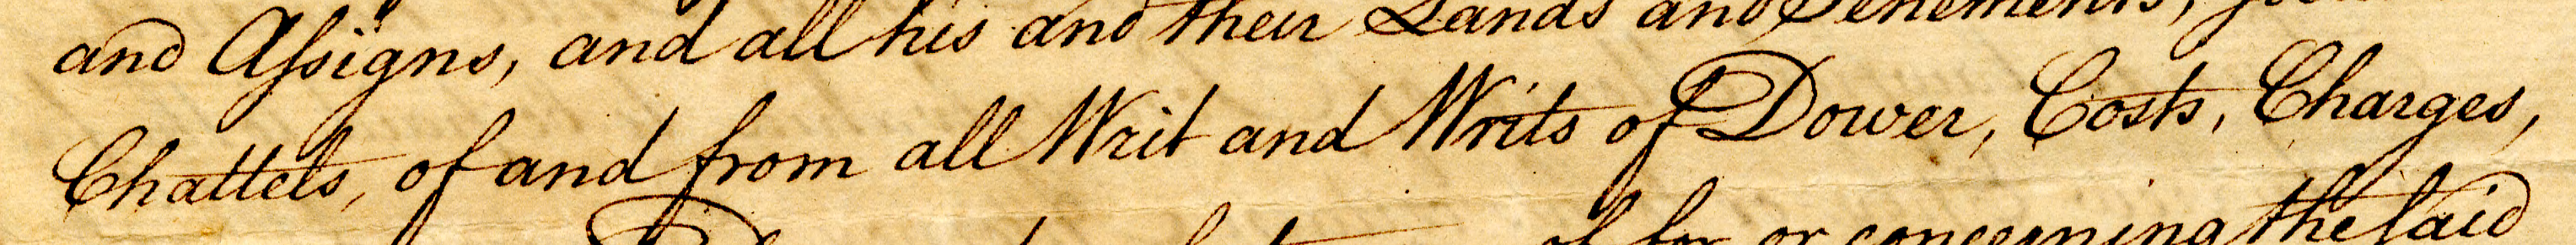Chattels, of and from all Writ and Writs of Dower, Costs, Charges,
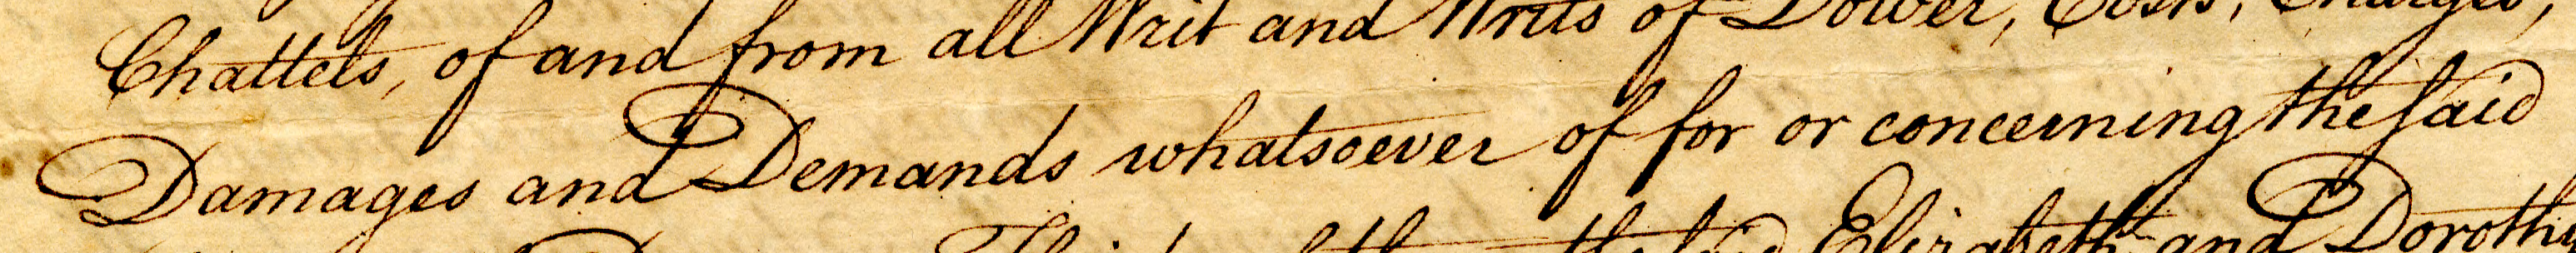Damages and Demands whatsoever of for or concerning the said
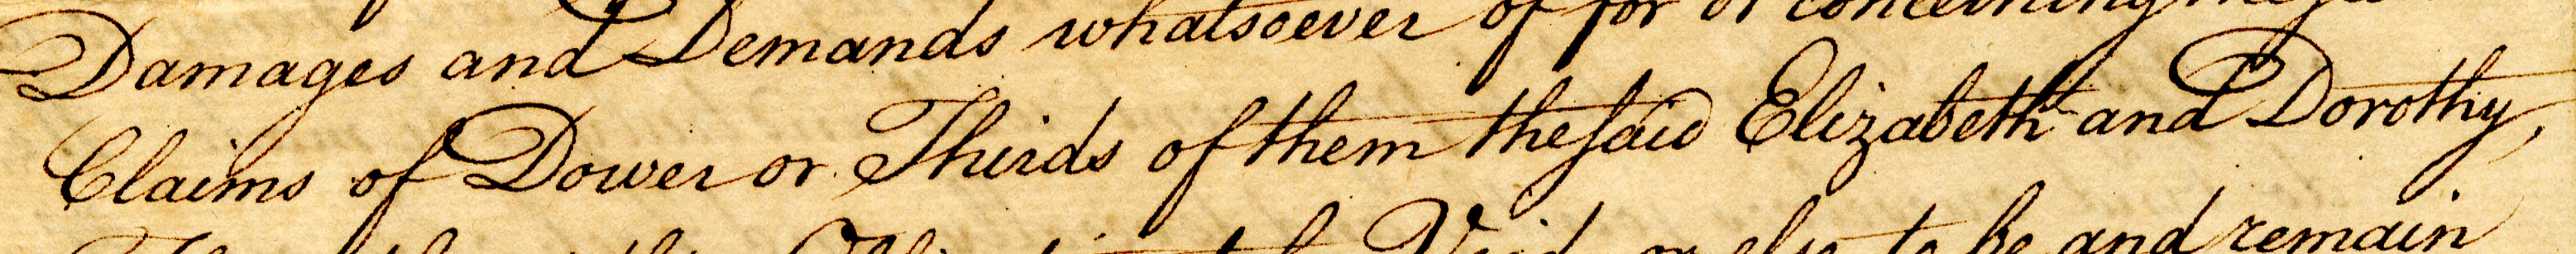Claims of Dower or Thirds of them the said Elizabeth and Dorothy,
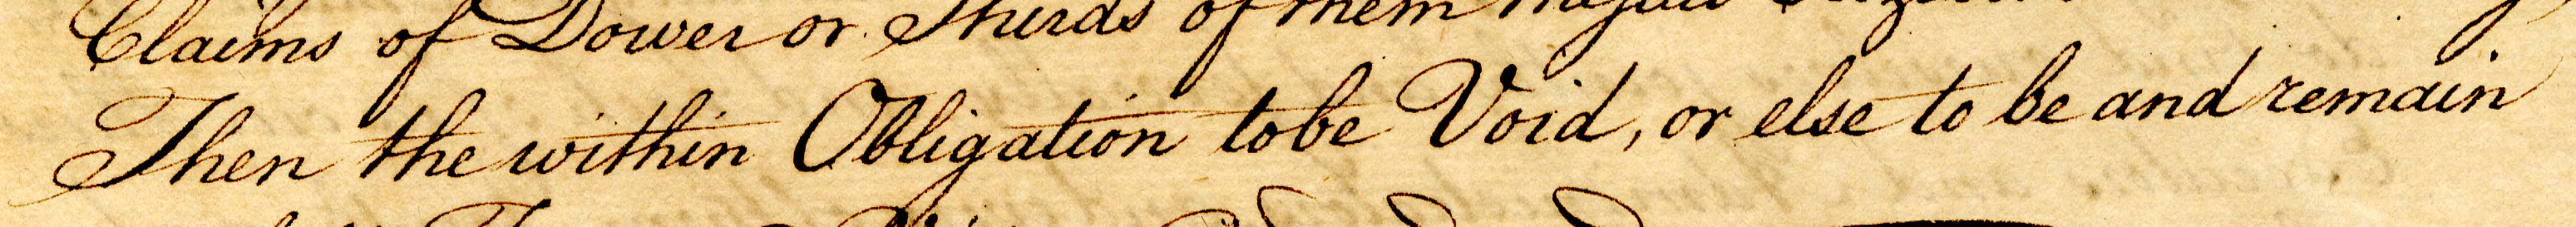Then the within Obligation to be Void, or else to be and remain
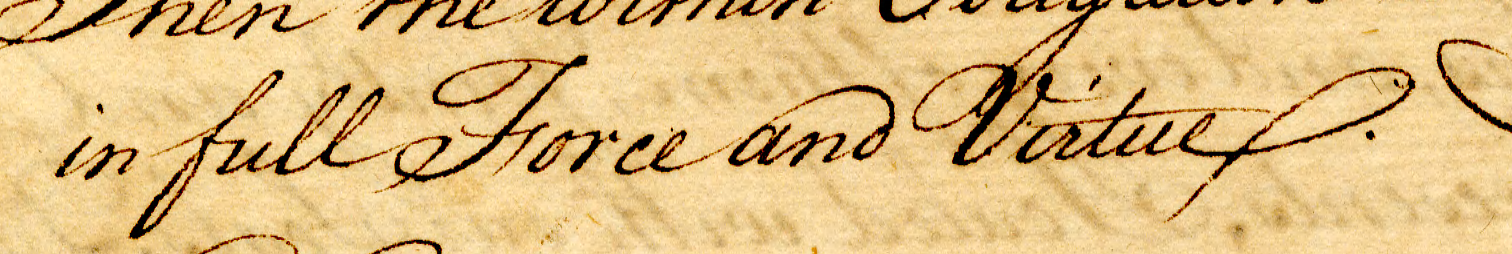in full Force and Virtue.
